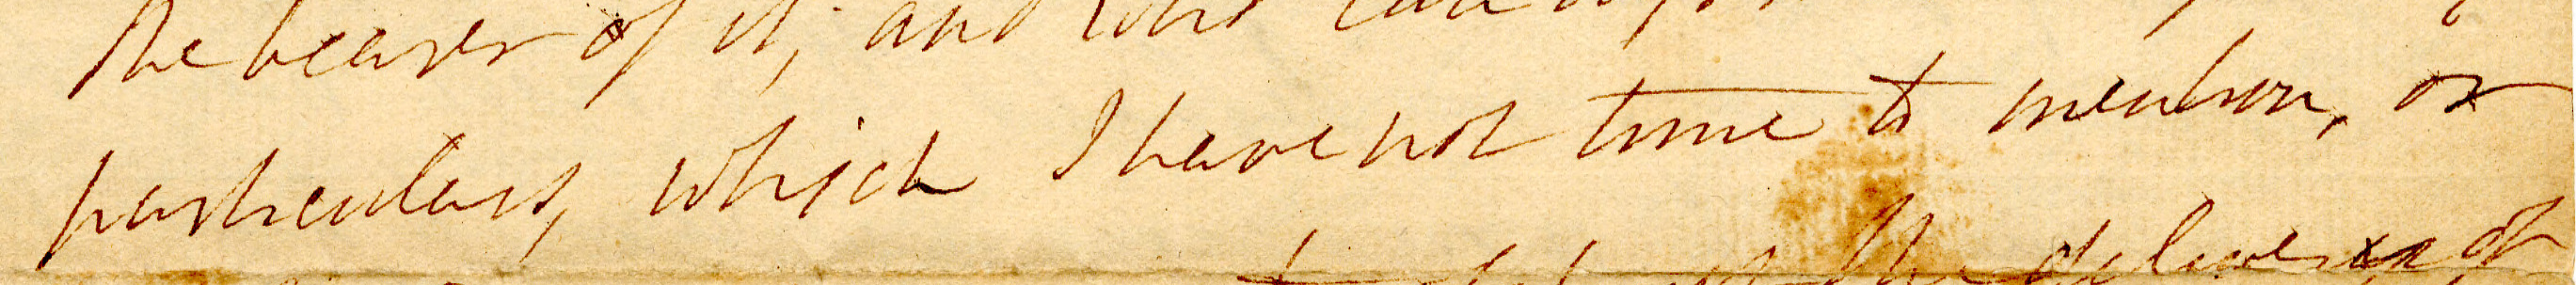particulars, which I have not time to mention, or
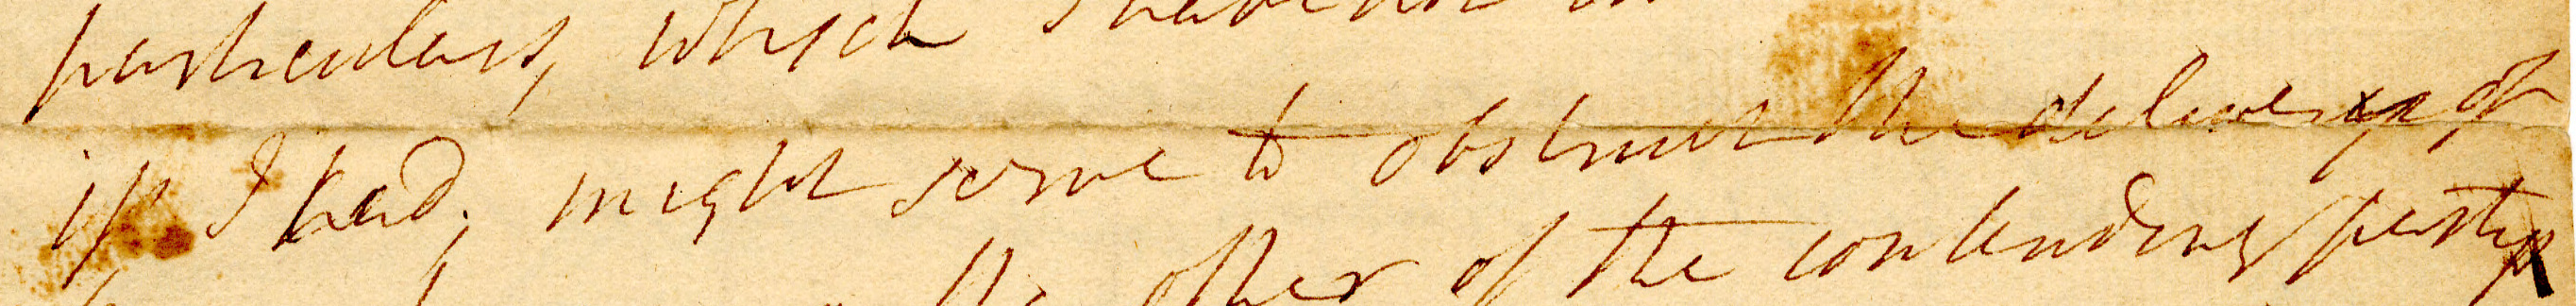if I had, might serve to obscure the delays of
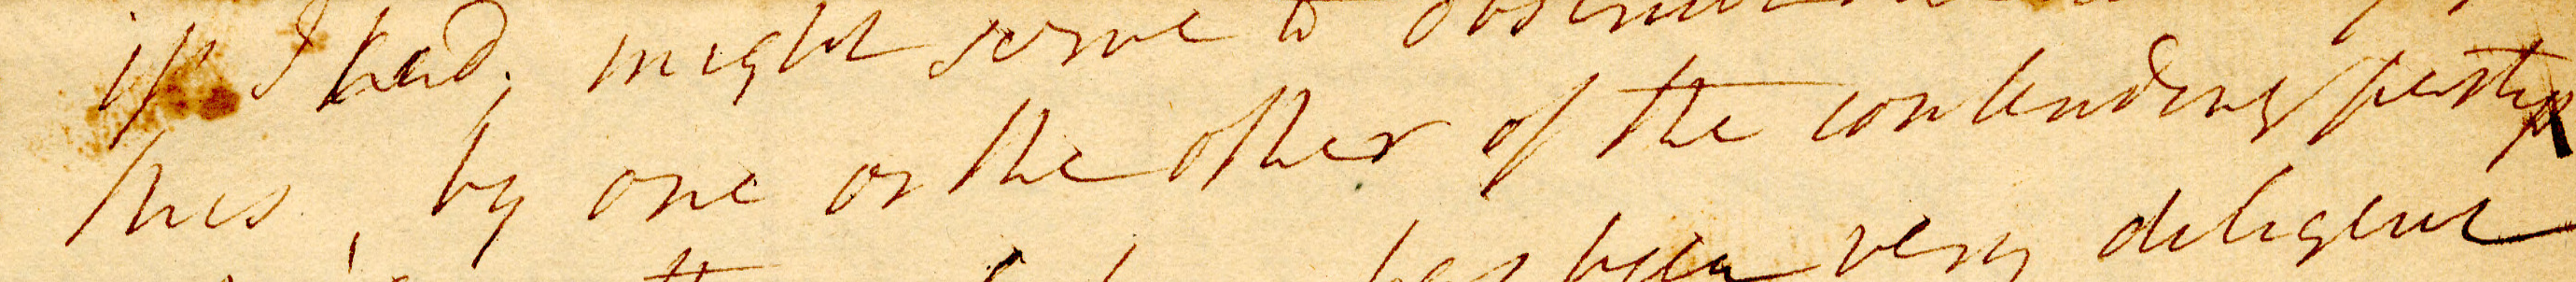this, by one or the other of the contending partys
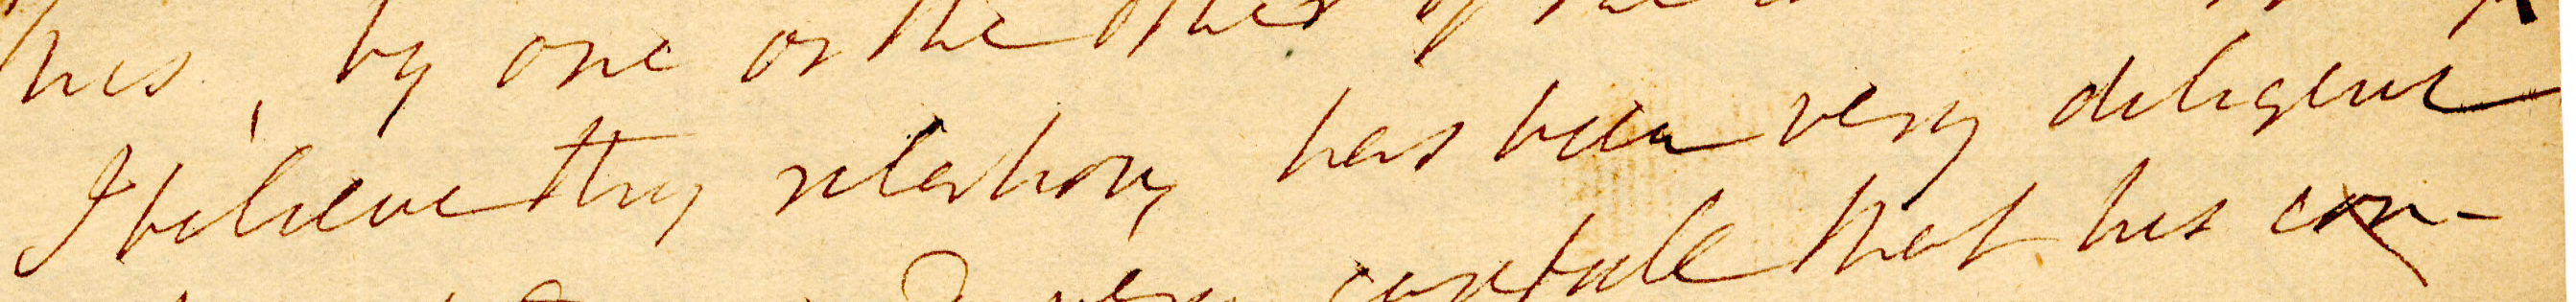I believe thy relation, has been very diligent
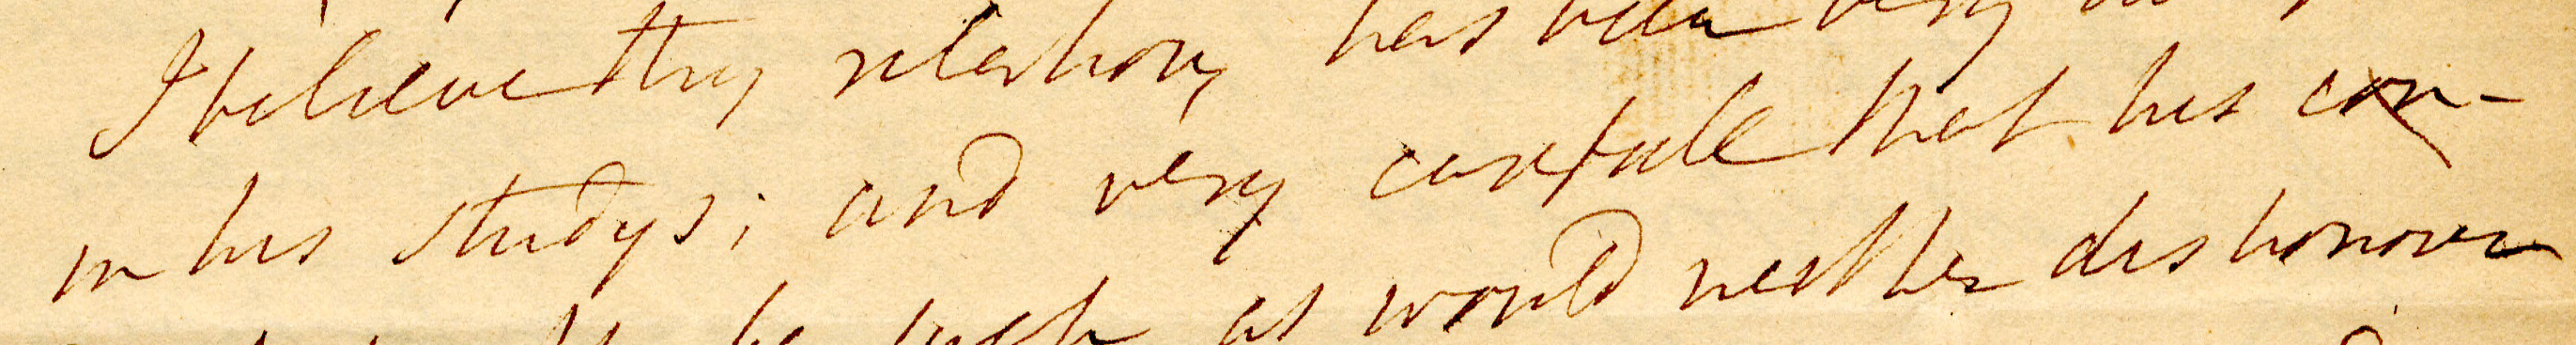in his studys; and very carfull that his con-
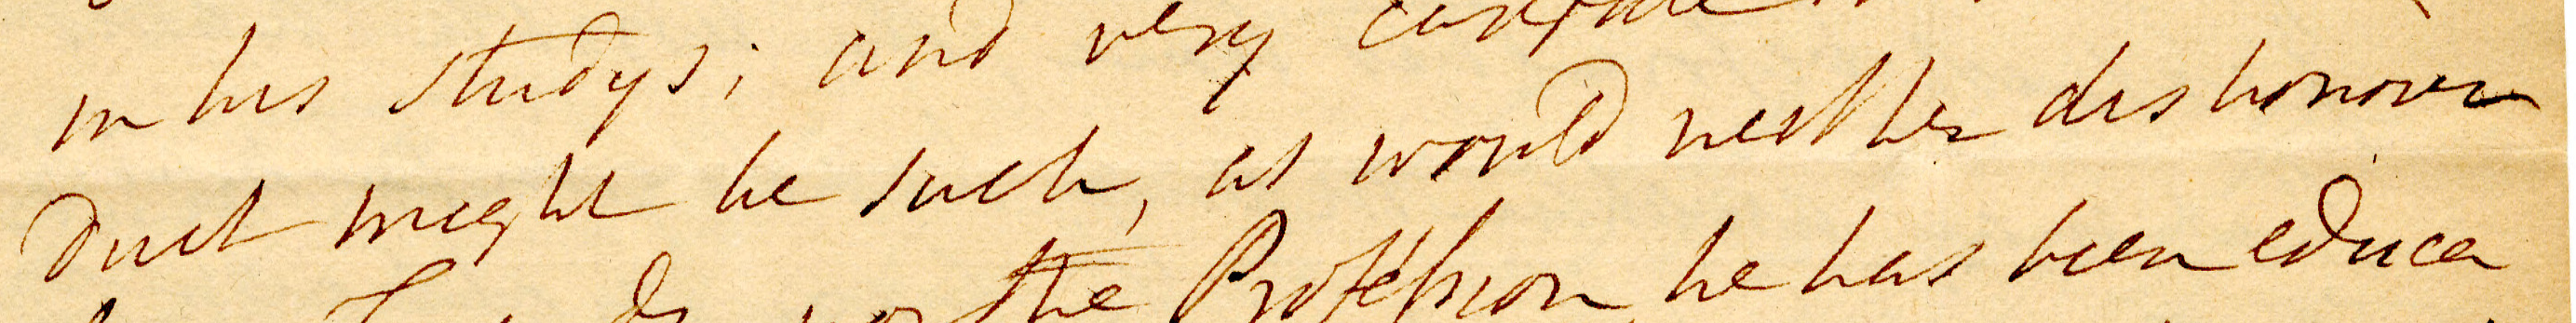duct might be such, as would neither dishonour
